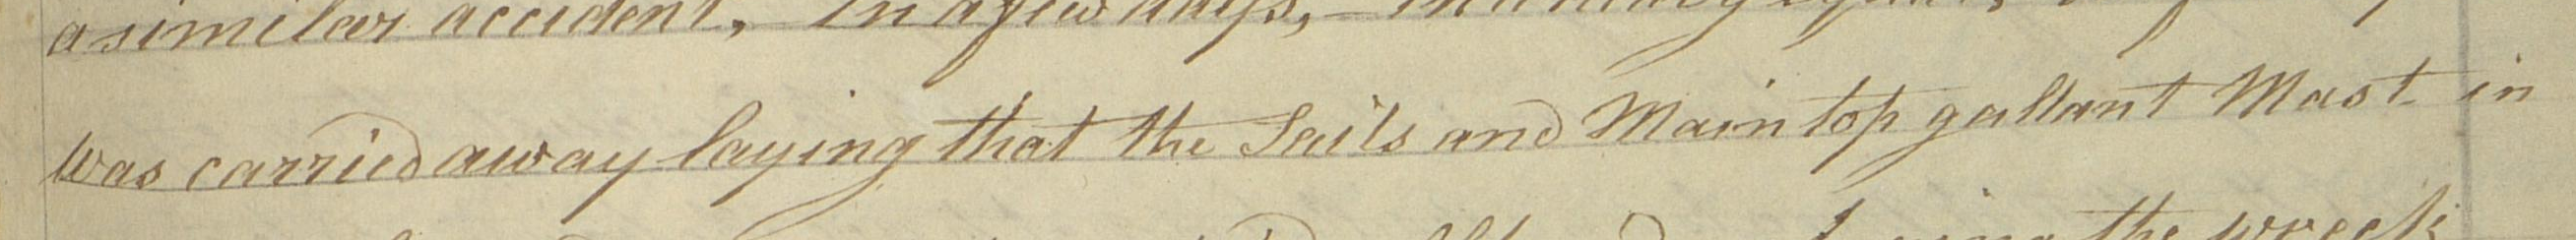was carried away laying that the Sails and Main top gallant Mast in
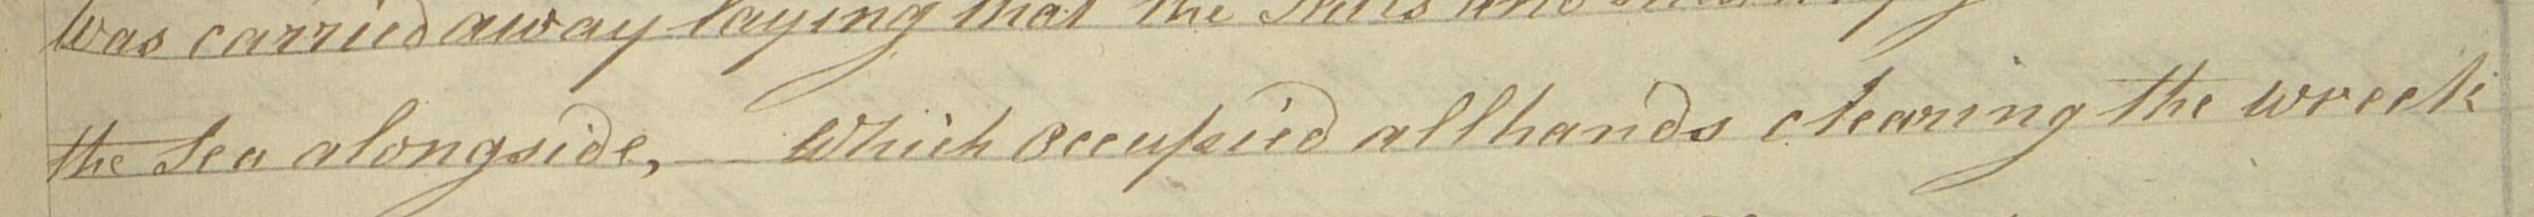the Sea alongside, Which occupied all hands clearing the wreck
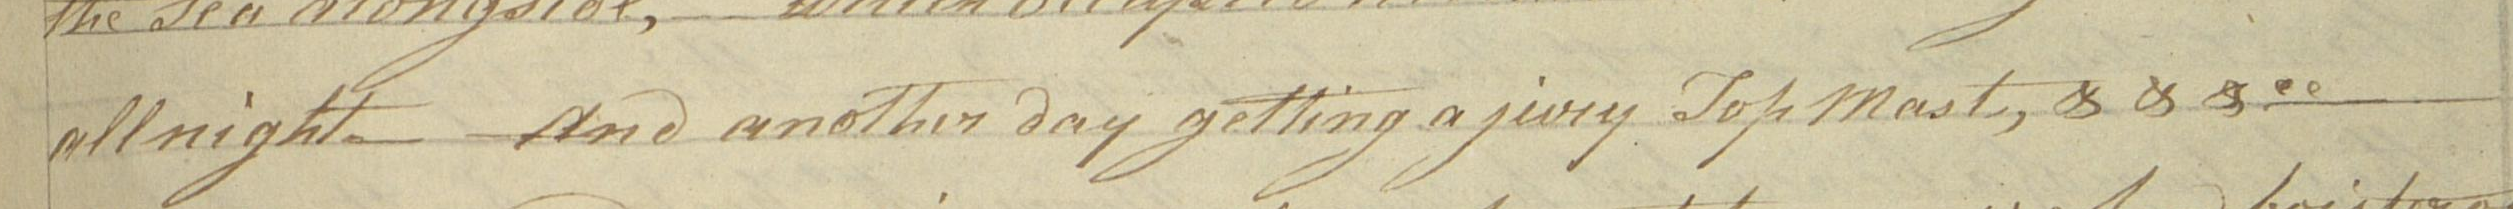all night And another day getting a jury Top Mast, & & &
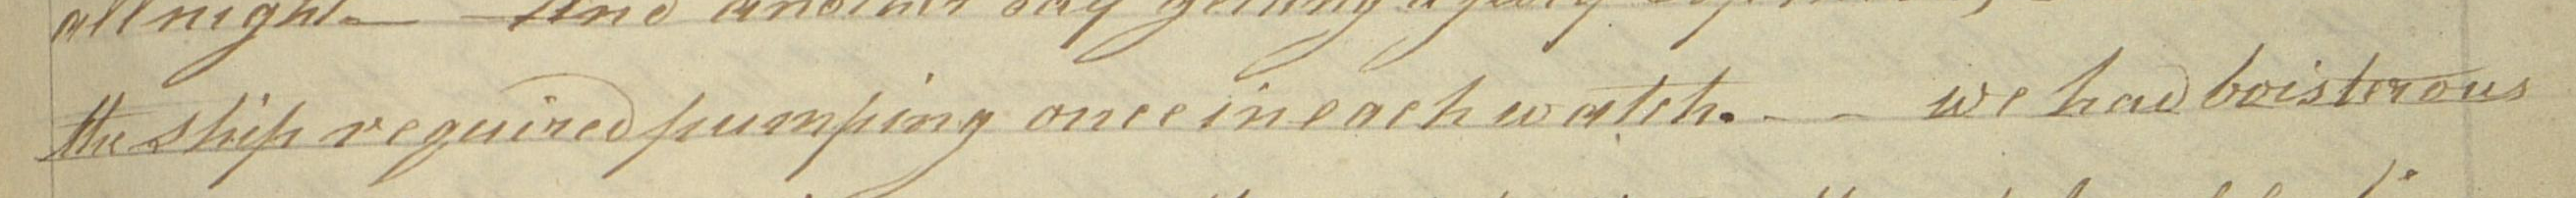the ship required pumping once in each watch. we had boisterous
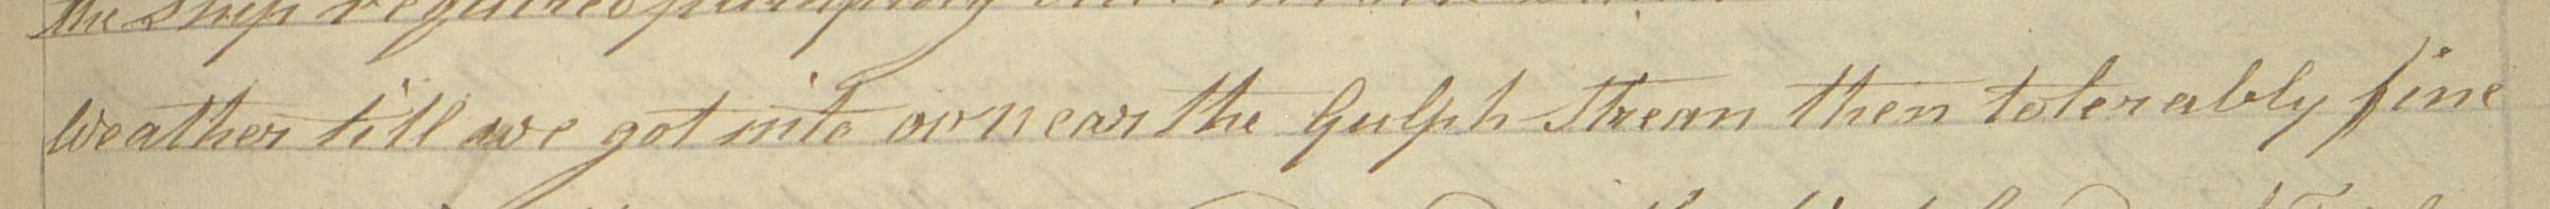weather till we got into or near the Gulph stream then tolerably fine
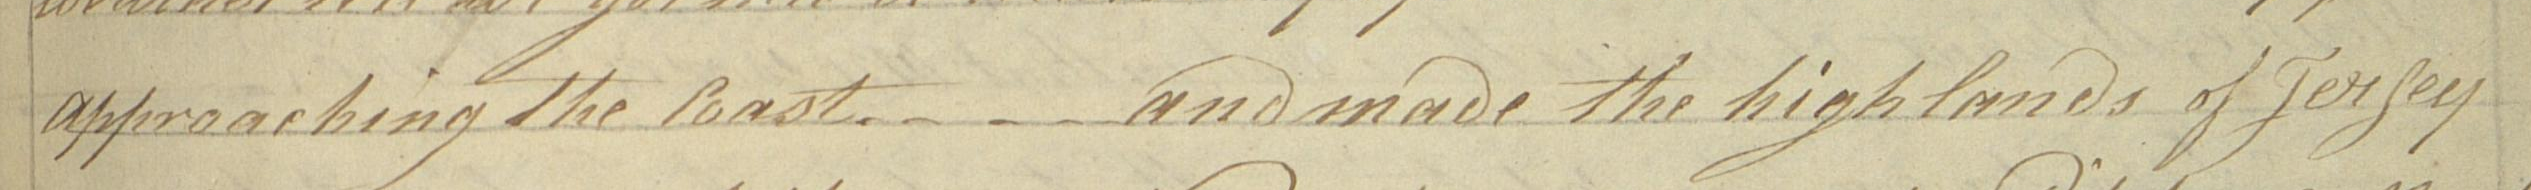approaching the Coast. and made the highlands of Jersey
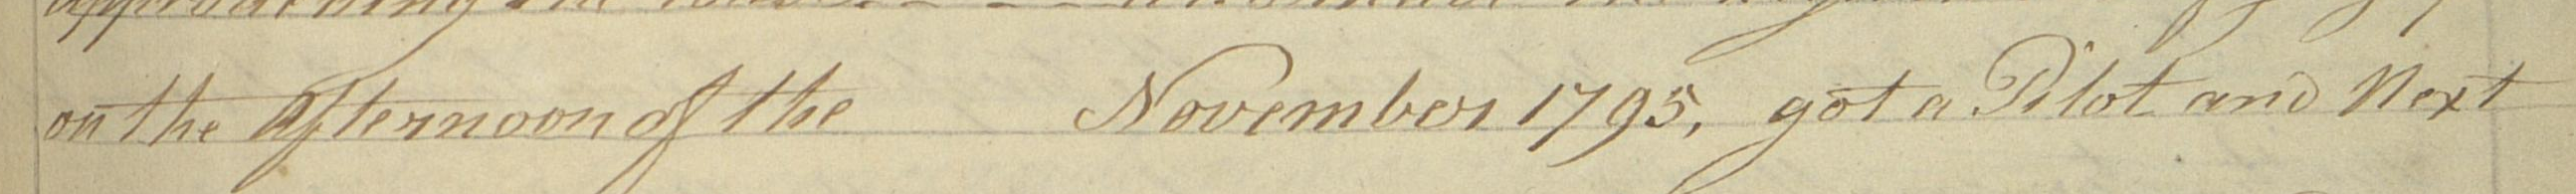on the afternoon of the November 1795, got a Pilot and Next
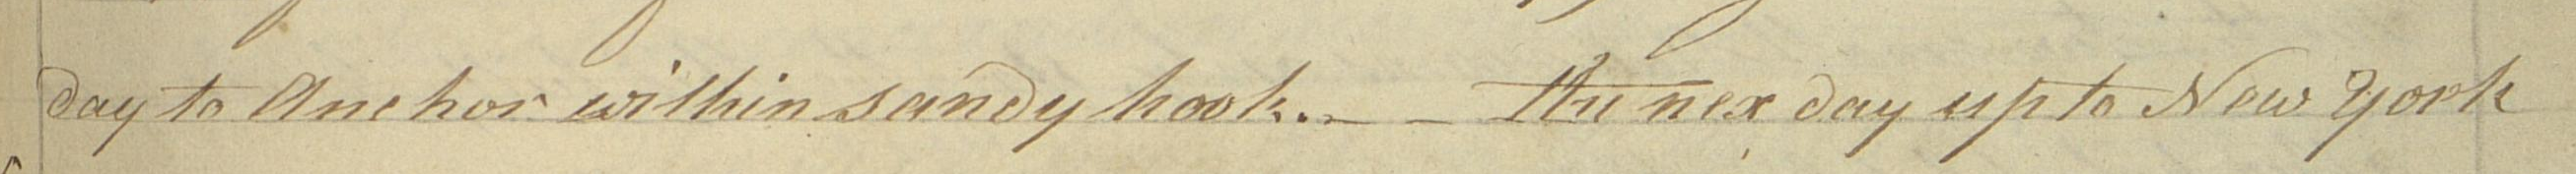day to Anchor within sandy hook. the nex day up to New York
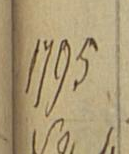1795
